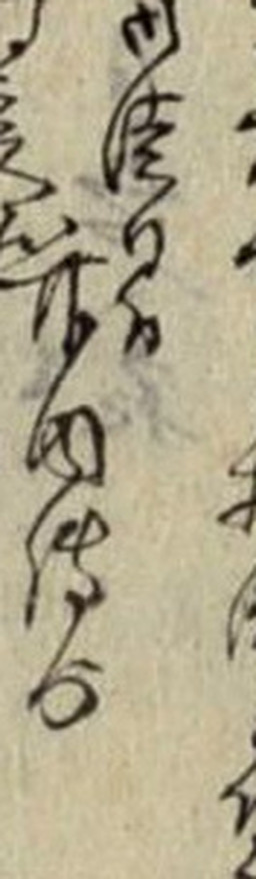竹内伝右衛門
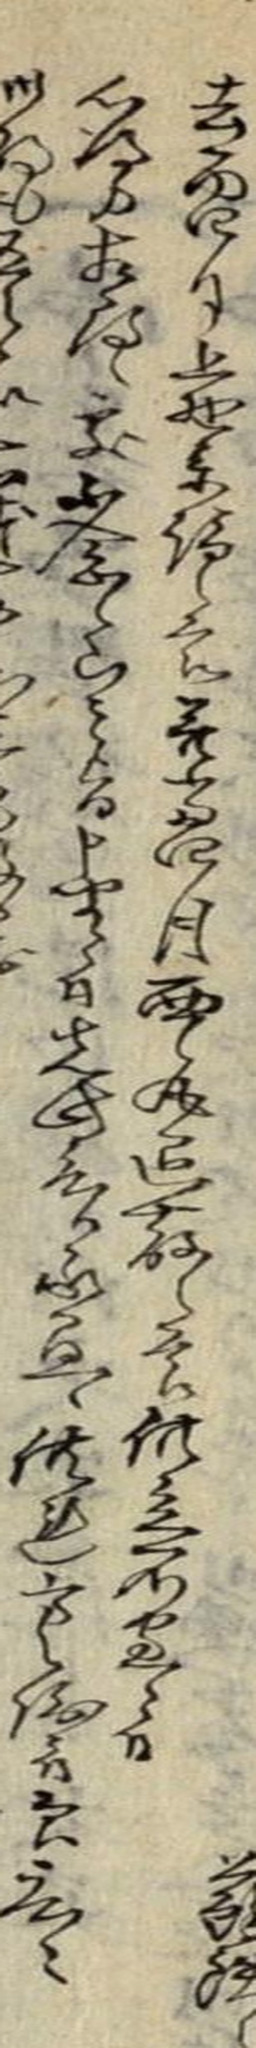心得方相尋候処不念之至に候旨申聞候付先此度は承置候供連方之儀に付ては度々
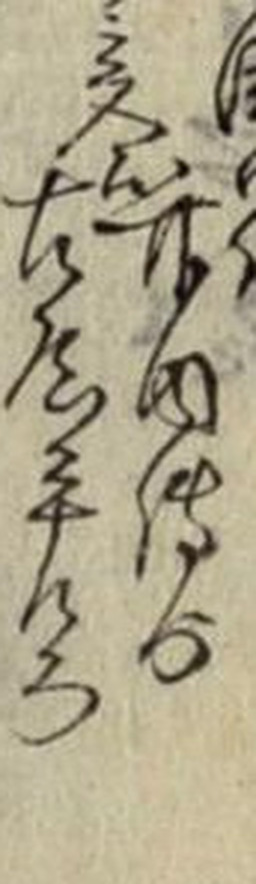古屋平左衛門

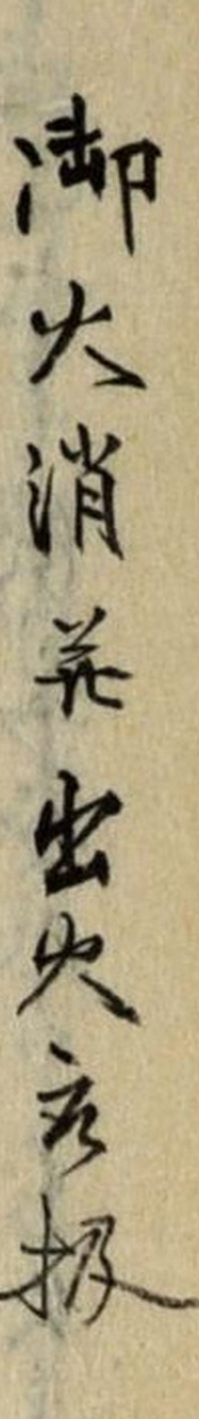御火消并出火取扱
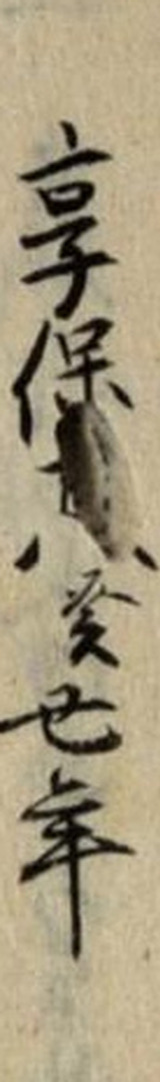享保十八癸丑年
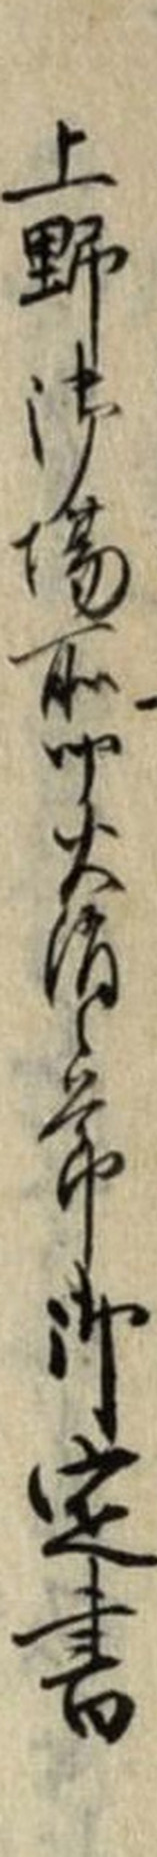上野御場所御火消之節御定書
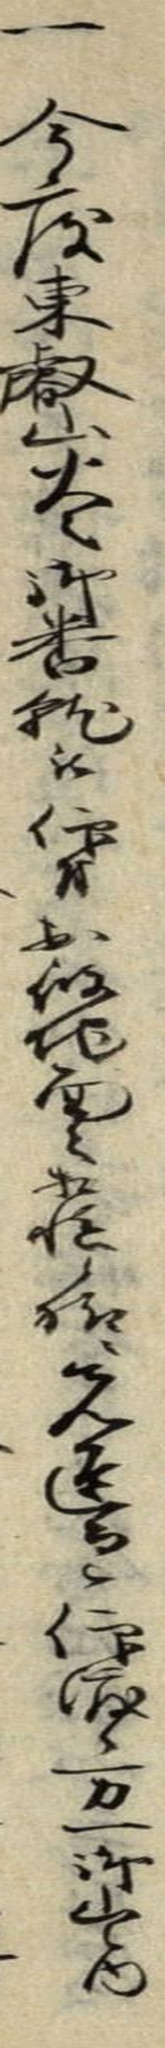一今度東叡山火之御番就被仰付於彼地面々相慎候様に先達て被仰渡候万一御山之内
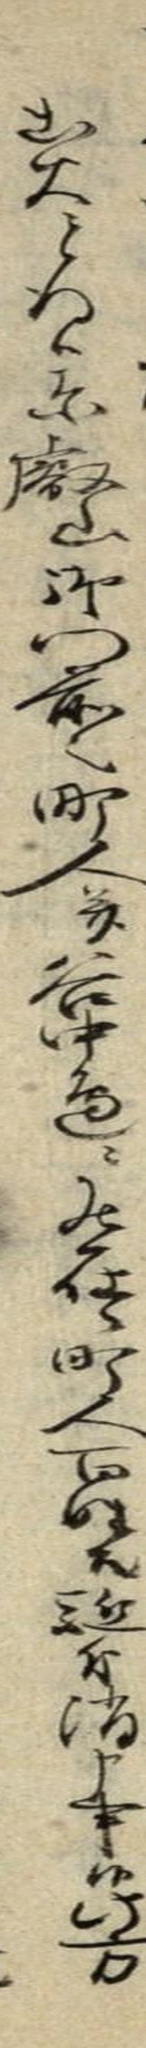出火に候得は東叡山御門前之町人并谷中辺に罷在候町人百姓共駆付消申事候此方
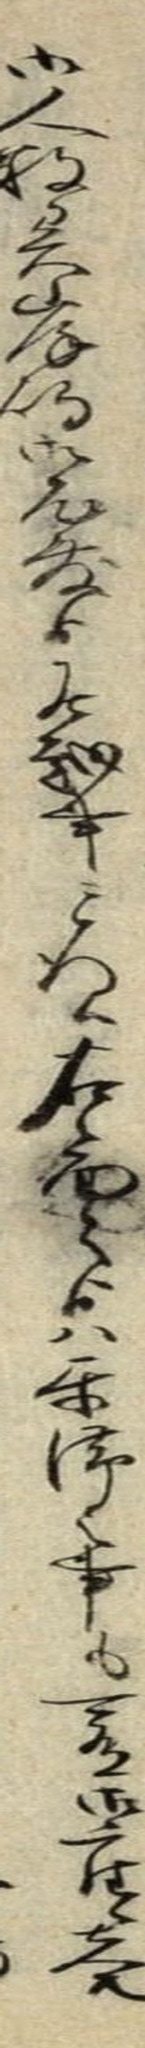御人数霊岸嶋御屋敷ゟ罷越事に候得は右之面々ゟは滞之事も可有御座候夫共
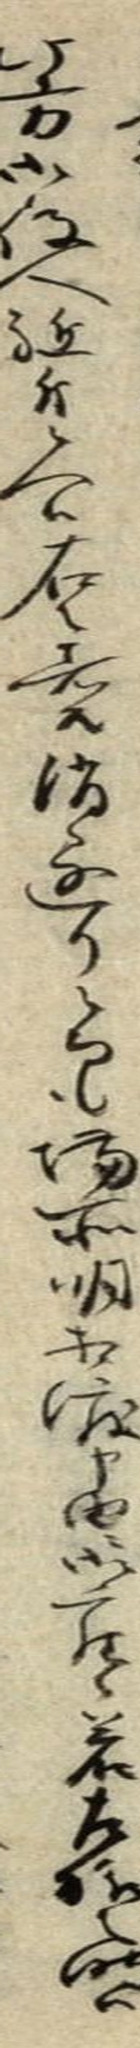此方御役人駆付候へは右之者共消懸り候ても場所明相渡申由に御座候若左様之時は
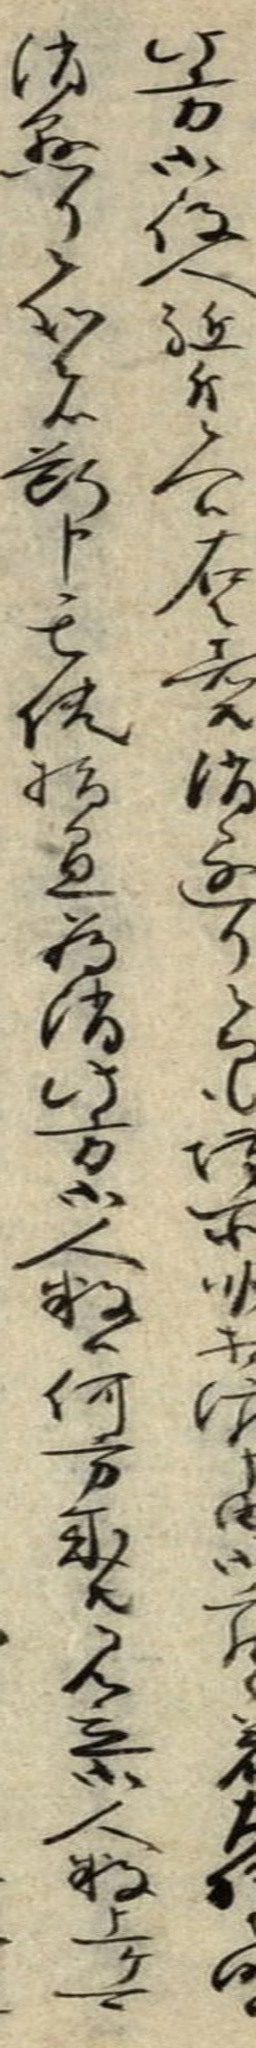消懸り候処は断申其儘指置為消此方御人数は何方成共見立御人数上け可
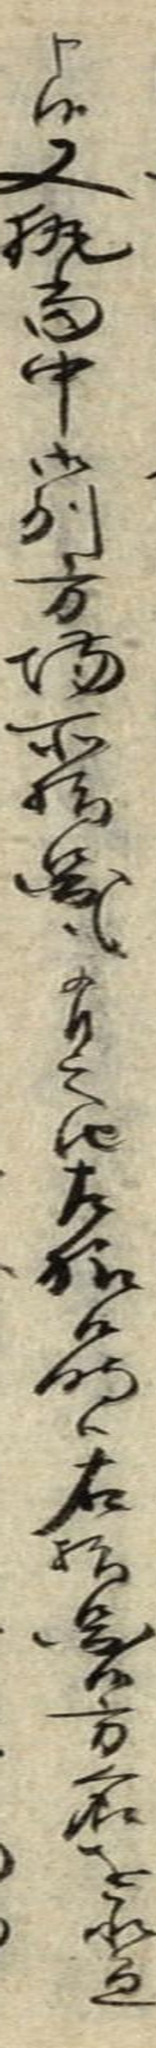申候又執当中御別方場所指図も有之由左様候時は右指図候方名を承置
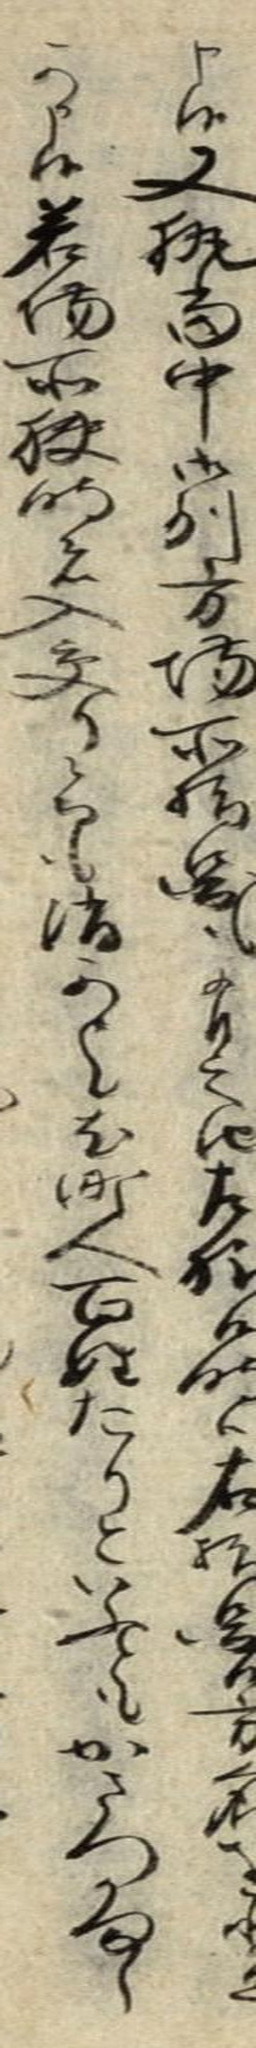可申候若場所狭時は入交り候ても消可申候尤町人百姓たりといふともかさつかまし
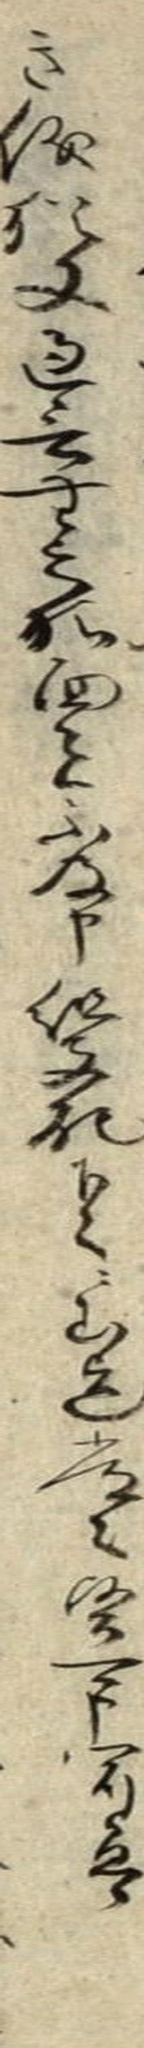き儀猶又過言無之様面々は不及申組支配下々に至迄常々堅可申聞置候
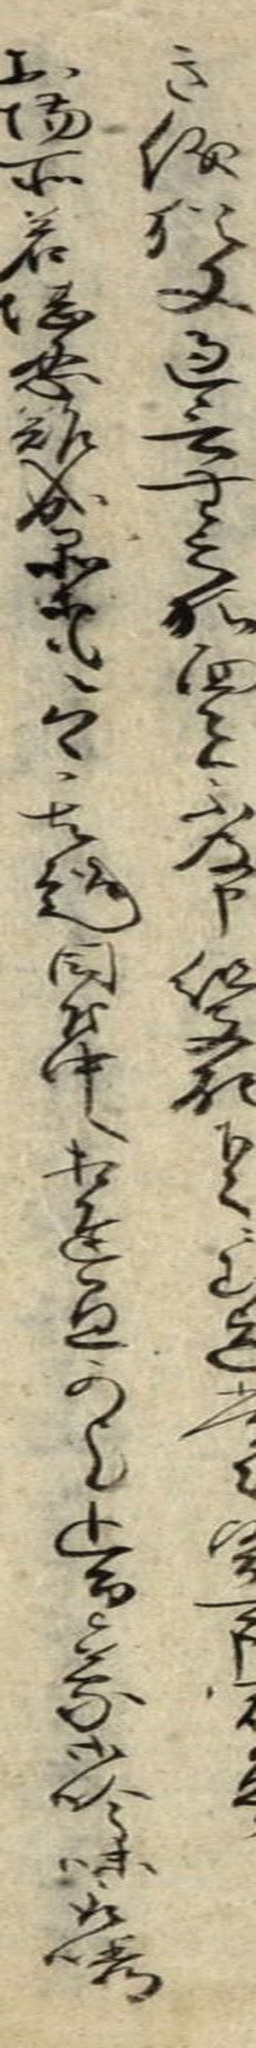一於場所若堪忍難成品等も候はゝ其趣目付中へ相達置可申候追て被蒙御吟味取唀
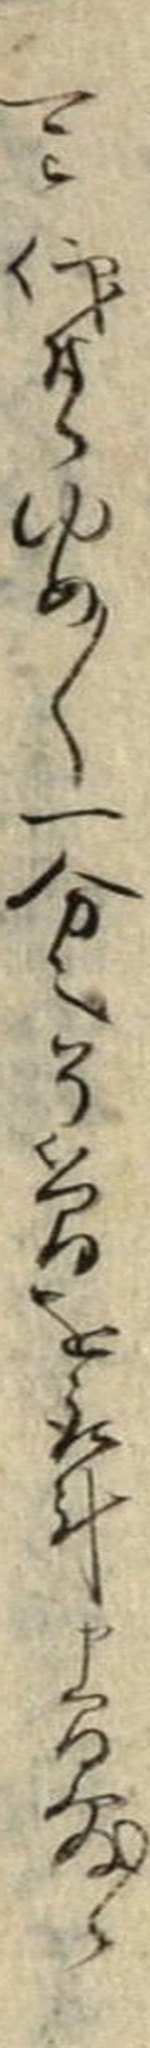可被仰付候ゆめ〳〵一分之了簡を取計申間敷候
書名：三都并道中之部
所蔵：福井県文書館 Fukui Prefectural Archives
